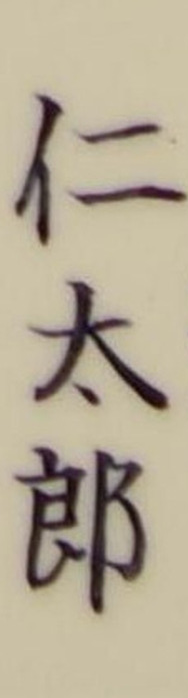仁太郎
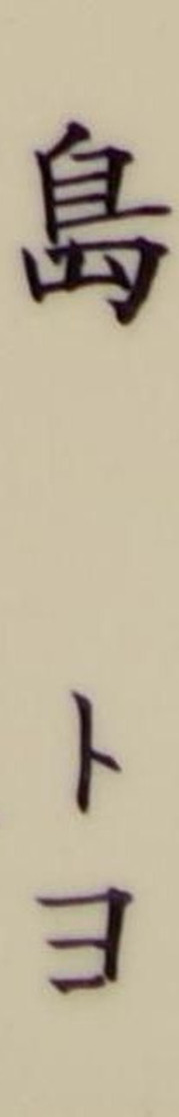島トヨ
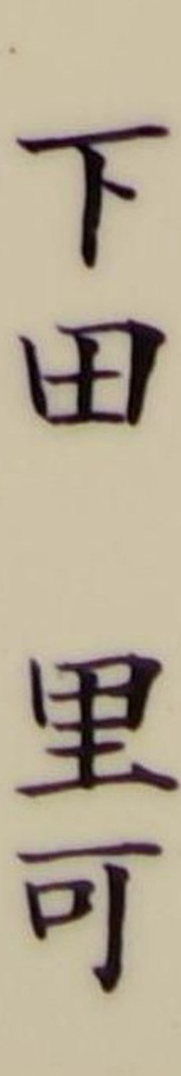下田里可
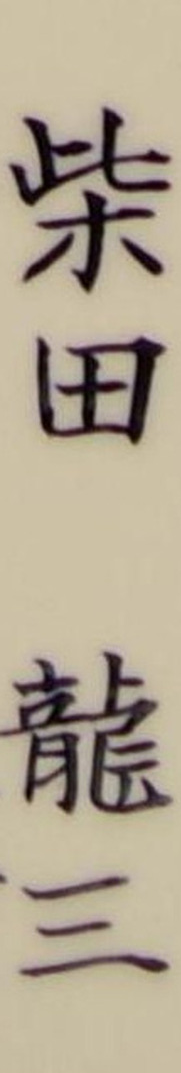柴田龍三
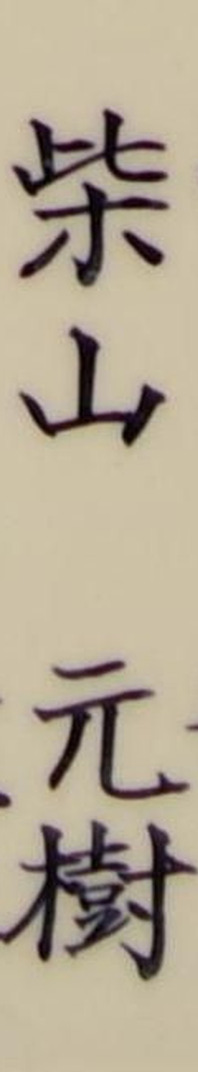柴山元樹
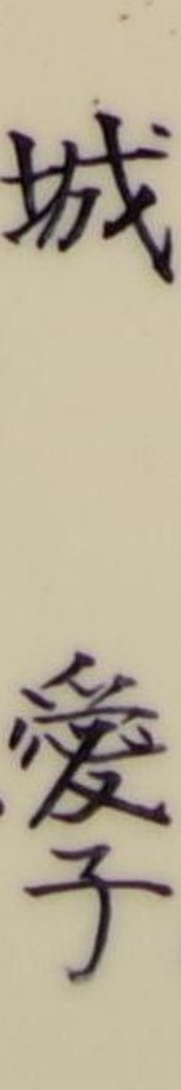城愛子
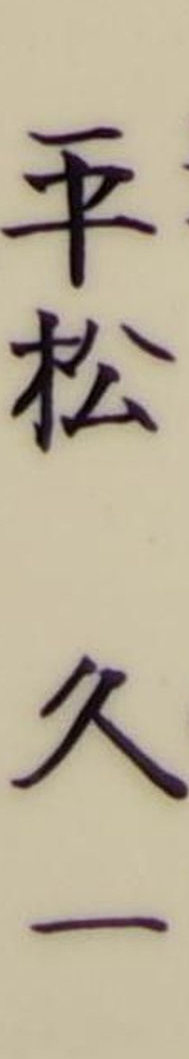平松久一
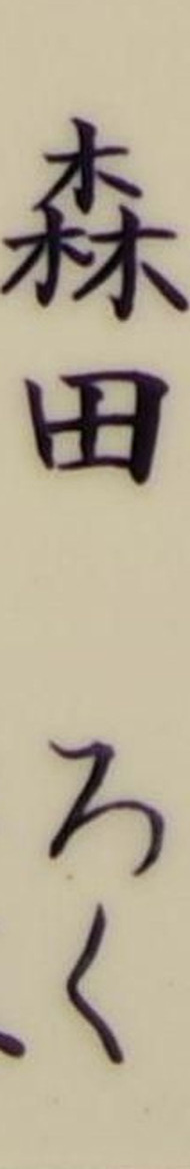森田ろく
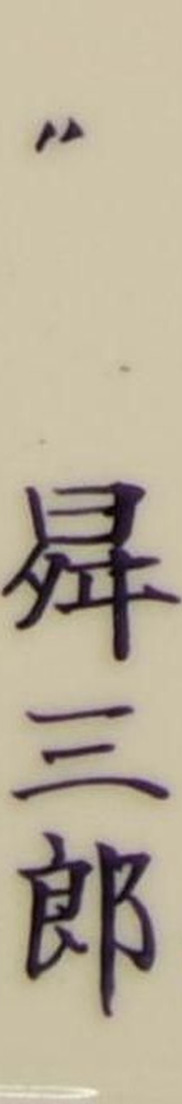昇三郎
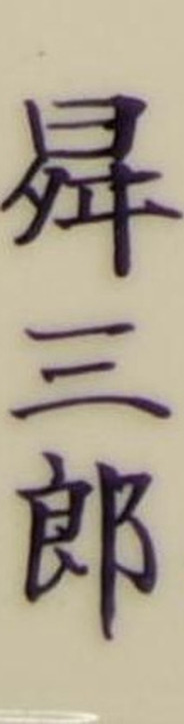昇三郎
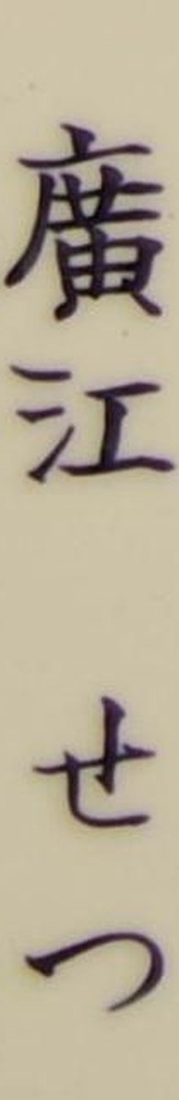廣江せつ

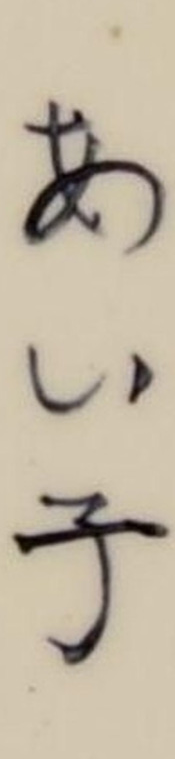あい子
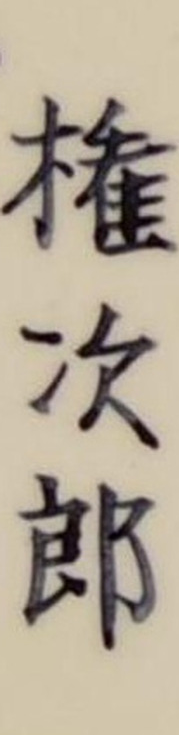権次郎
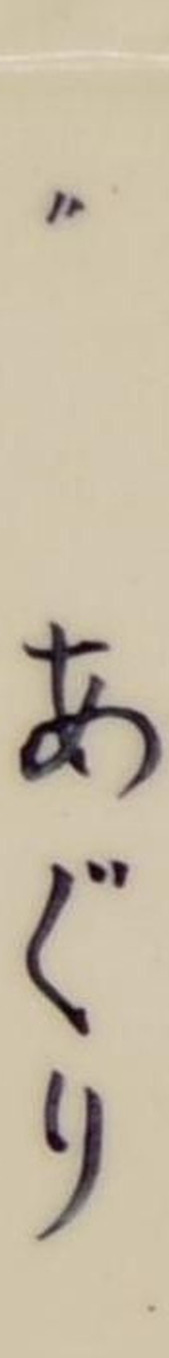あぐり
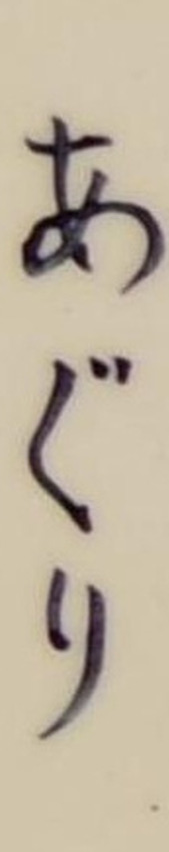あぐり
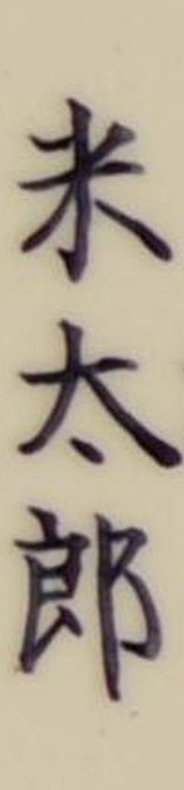米太郎
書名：E~L
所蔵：高野山金剛峯寺
